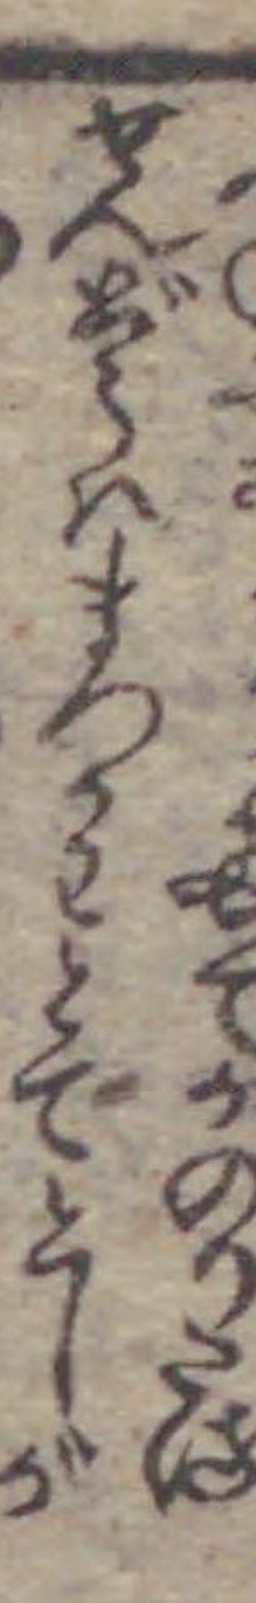せんどうはまつかわとてとしが
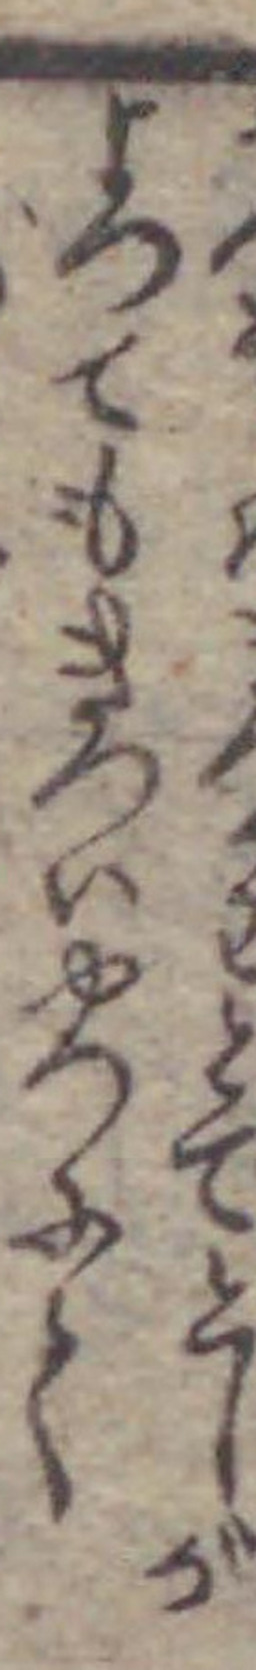よつてもきついやつにて
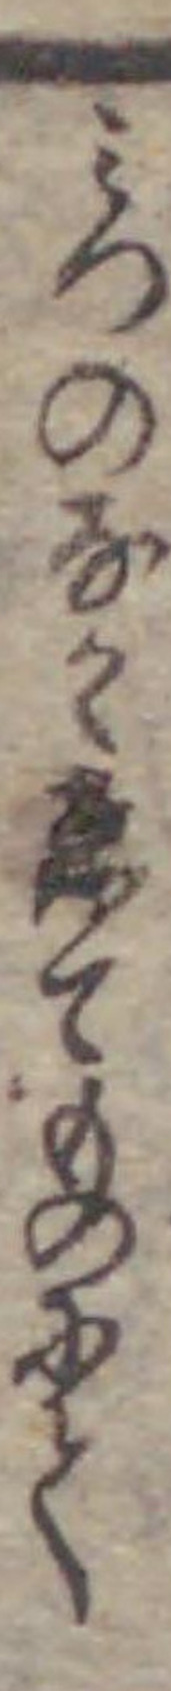みつのなかゝゑてものにて
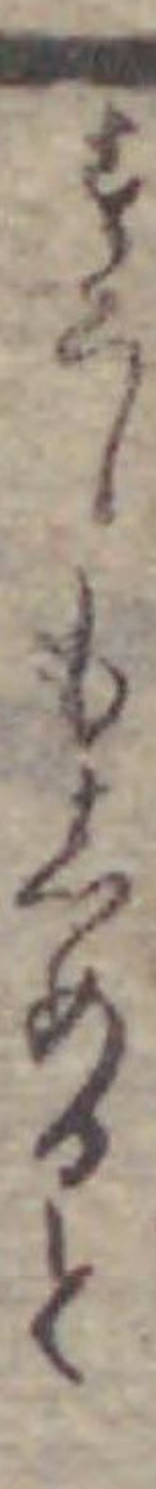すこしもしめると
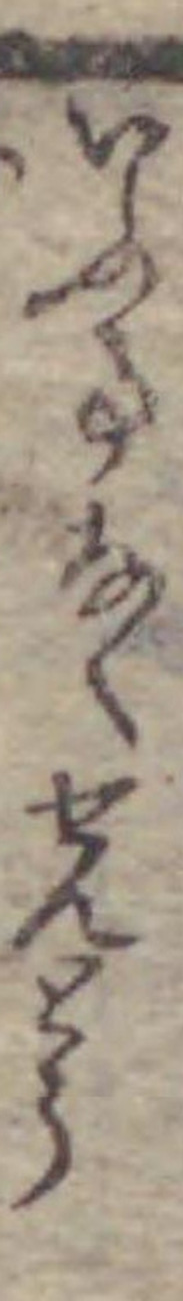いふ事なくせんとう
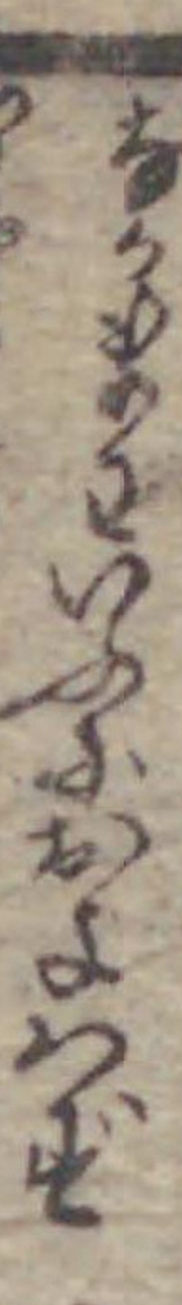なかまわいふにおよはず
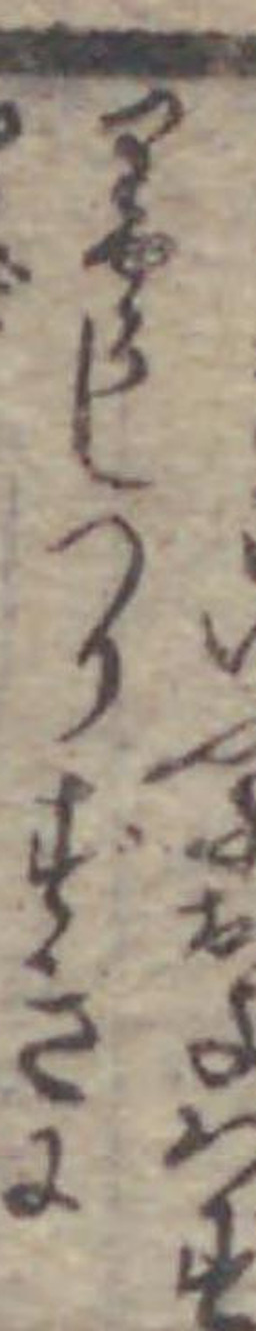りやうしつりずきに
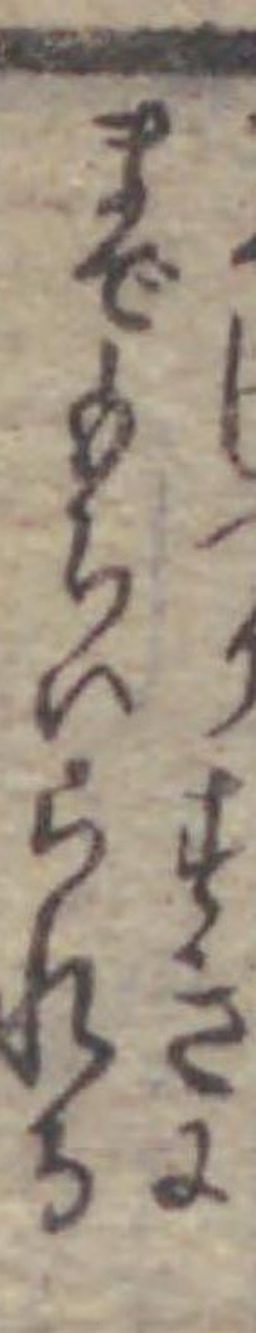までもちいられる
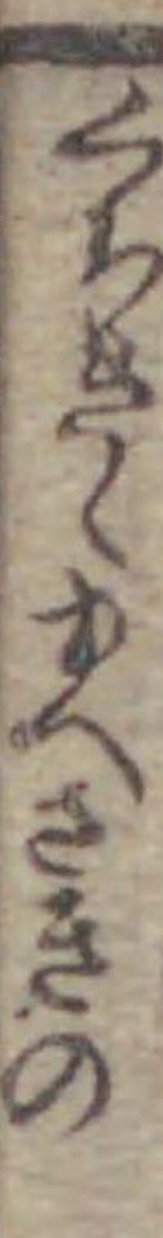くちきくゆへさきの
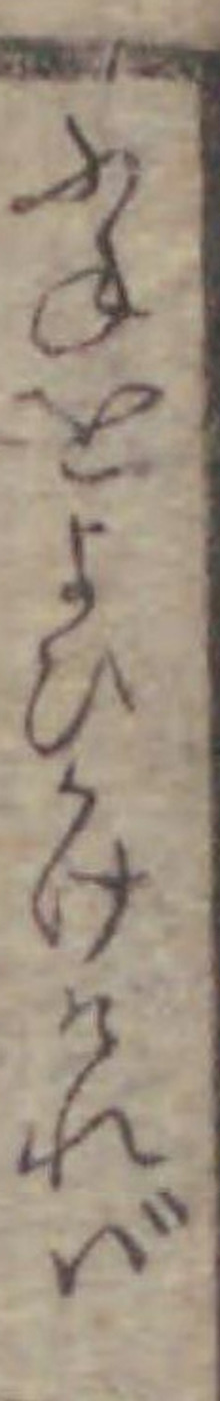ふねをよひかけければ
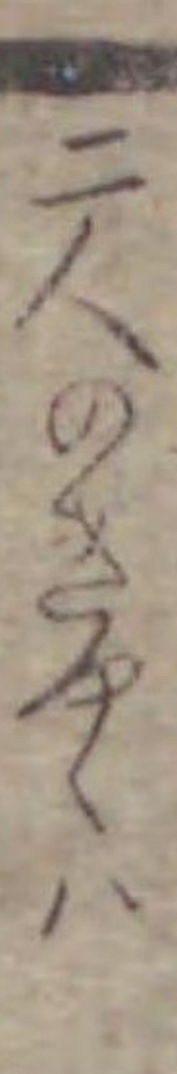二人ののきやくは
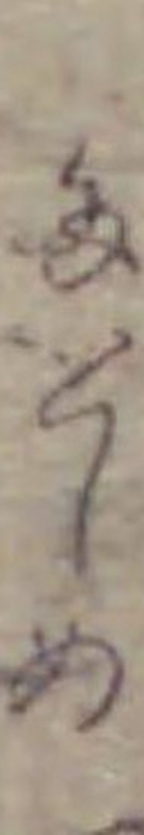たをしめ
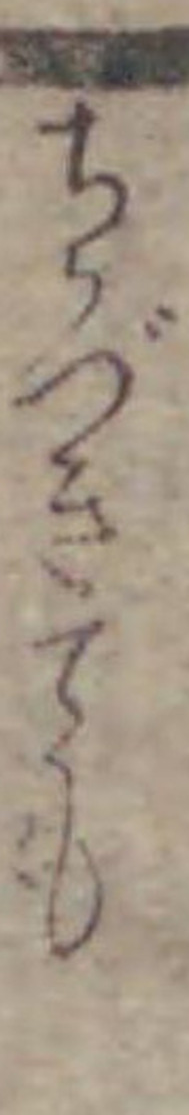ちかづきても
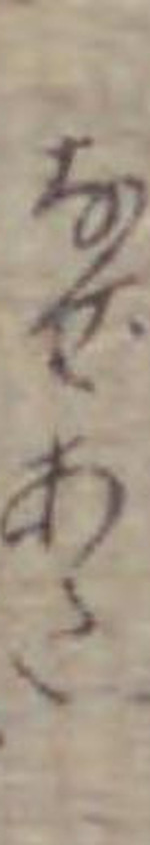なぜあた
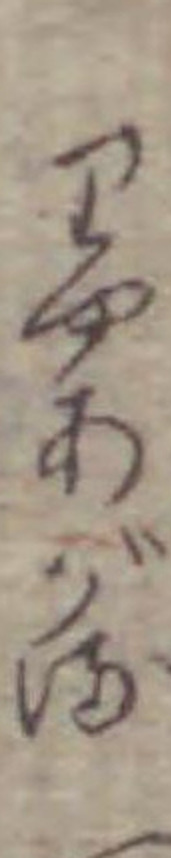りやあがる
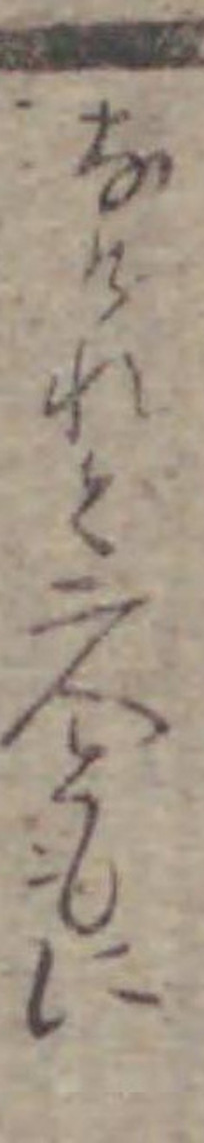なけれと二人ともに
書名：談芭菰誉詞 : 3巻
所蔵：国立国会図書館 National Diet Library, JAPAN
